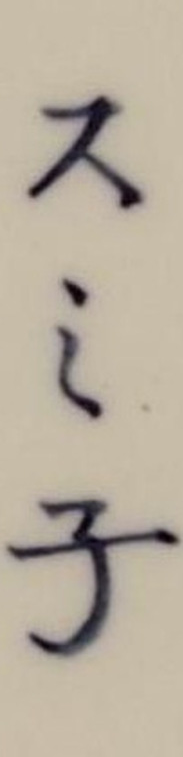スミ子
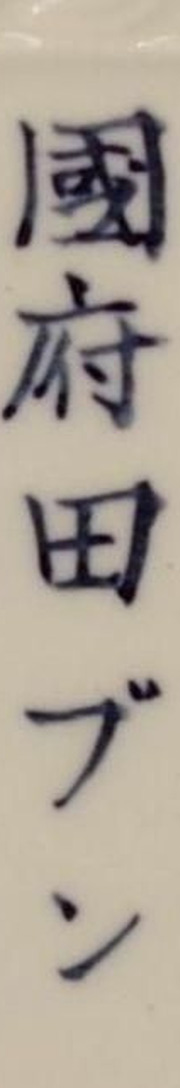国府田ブン
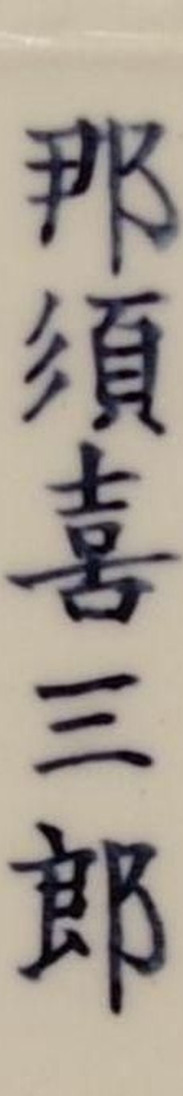那須喜三郎
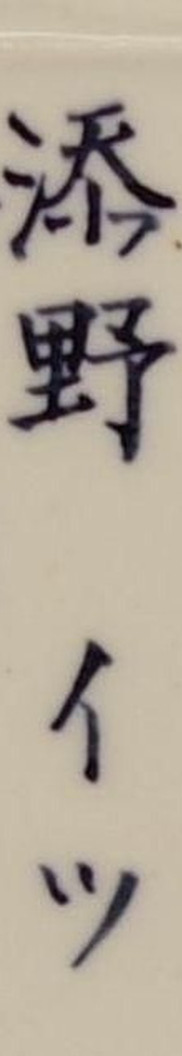添野イツ
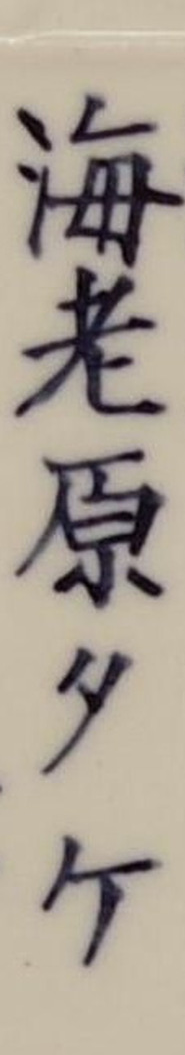海老原タケ
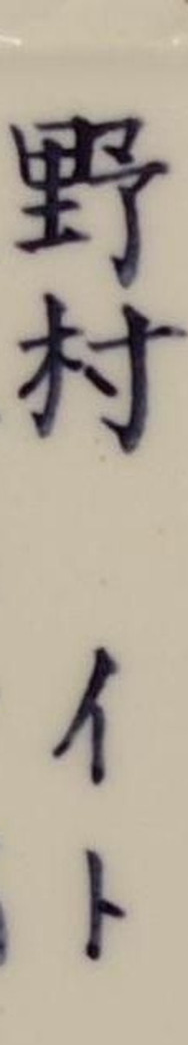野村イト
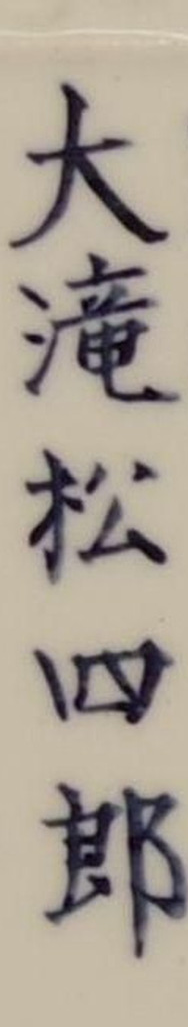大滝松四郎
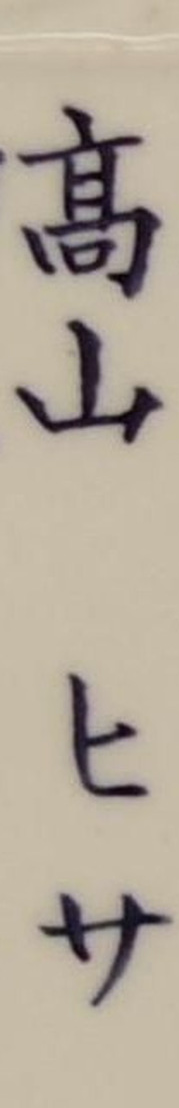高山ヒサ
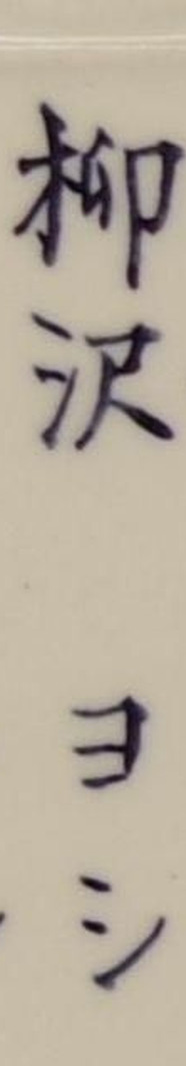柳沢ヨシ
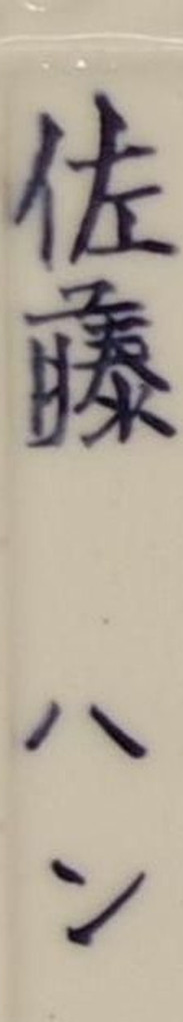佐藤ハン

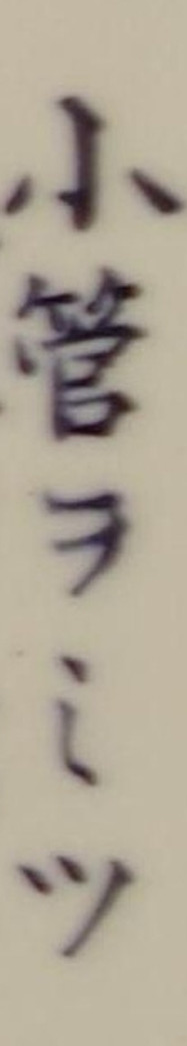小管ヲミツ
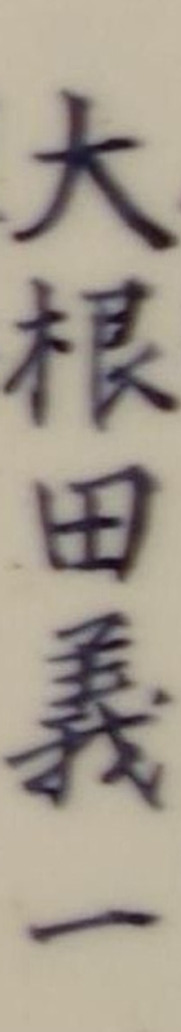大根田義一
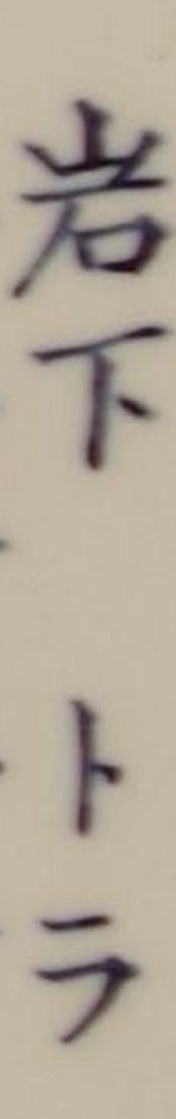岩下トラ
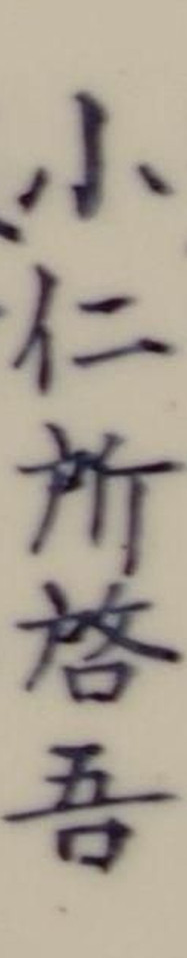小仁所啓吾
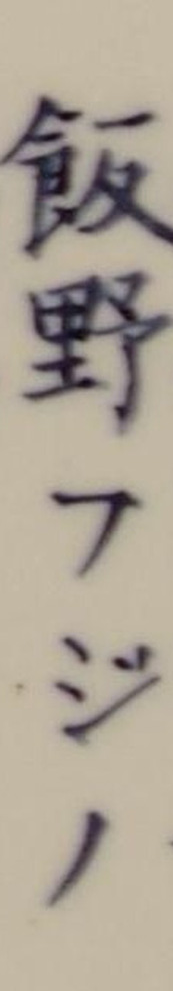飯野フジノ
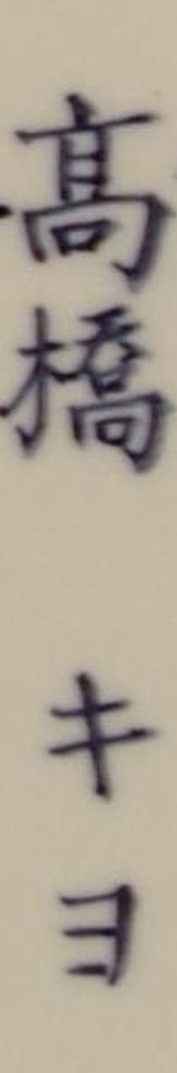高橋キヨ
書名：M~S
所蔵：高野山金剛峯寺
